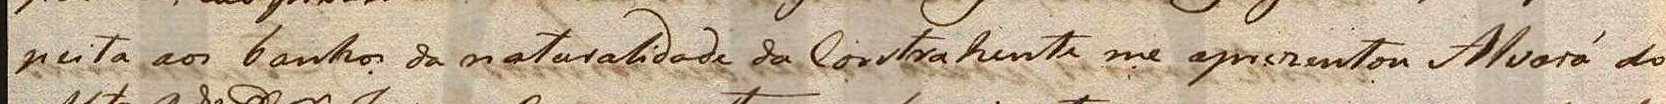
peita aos banhos da naturalidade da Contrahente me aprezentou Alvará do
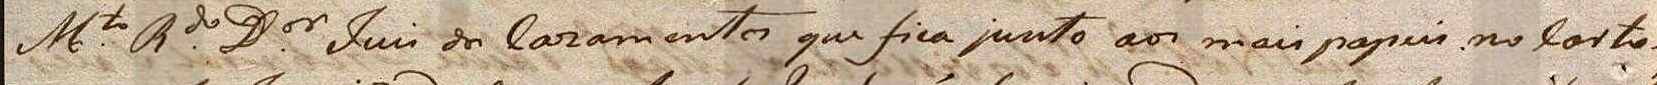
M.to R.do D.or Iuis do Cazamentos que fica junto aos mais papeis no Carto
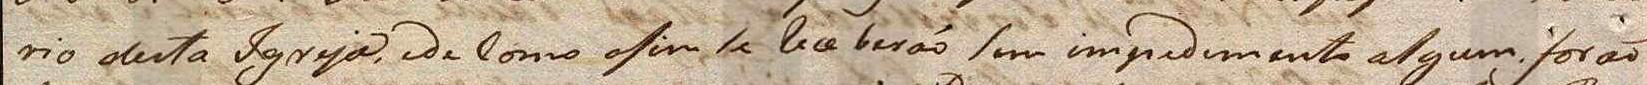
rio desta Igreja, e de Como asim se Receberaõ sem impedimento algum. foraõ
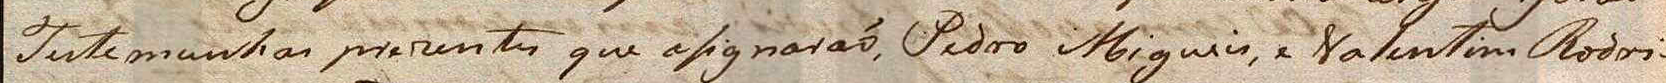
Testemunhas prezentes que asignaraõ, Pedro Migueis, e Valentim Rodri
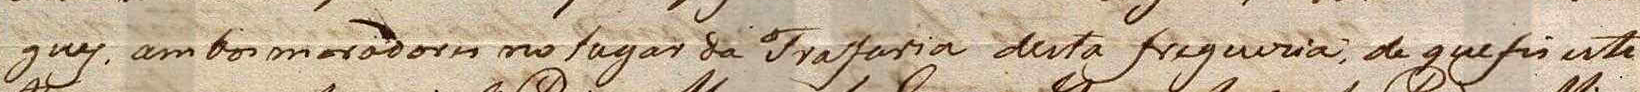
gues, ambos moradores no lugar da Trafaria desta freguezia, de que fis este
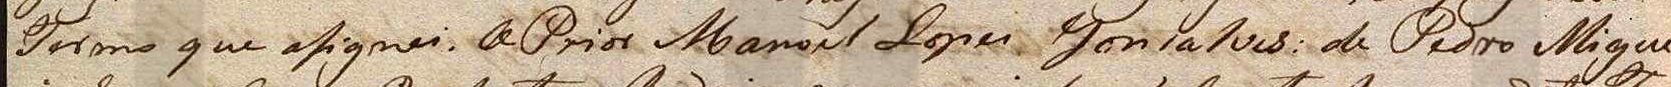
Termo que asignei: O Prior Manoel Lopes Gonsalves: de Pedro Migue
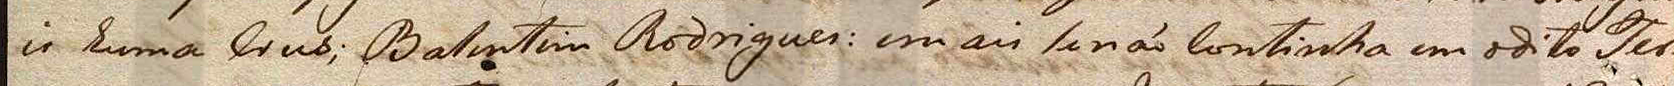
is huma Crus; Balentim Rodrigues: e mais senaõ Continha em o dito Ter
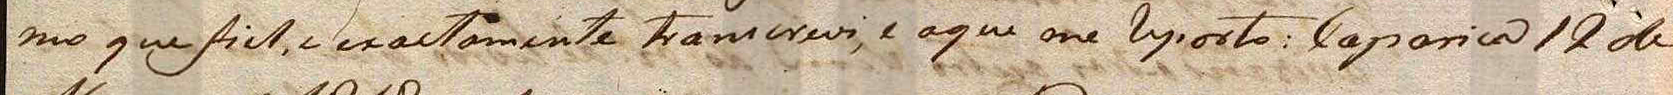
mo que fiel, e exactamente transcrevi, e aqui me Reporto: Caparica 12 de
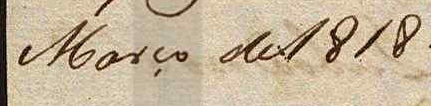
Março de 1818.
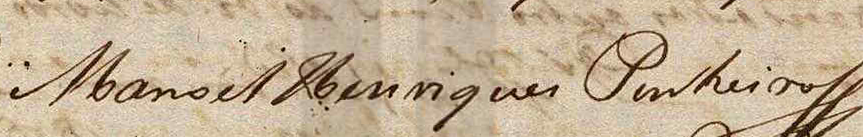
Manoel Henriques Pinheiro
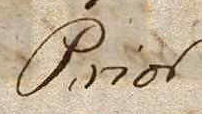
Prior
